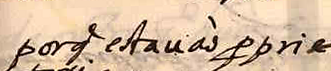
porq̄ estauão ꝓprie
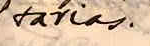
tarias.
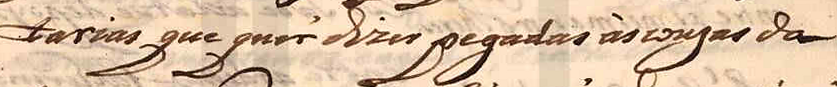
tarias que quer dizer pegadas às couzas da
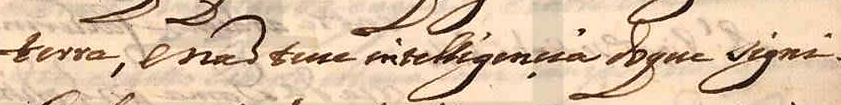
terra, e naõ teue intelligencia do que signi
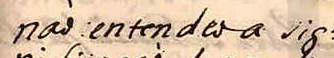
naõ entendeo a sig
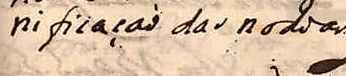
nificaçaõ das nodoas
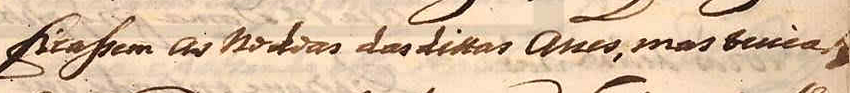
ficassem as nodoas das dittas aues, mas teue a
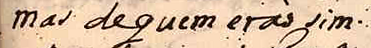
mas de quem eraõ sim.
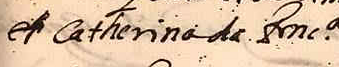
e Catherina da Fonc.a
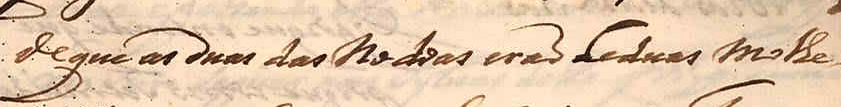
de que as duas das nodoas eraõ de duas molhe
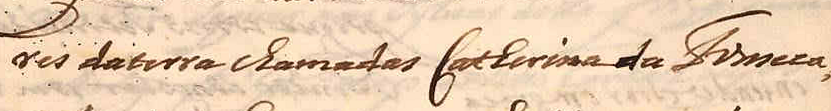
res da terra chamadas Catherina da Fonseca
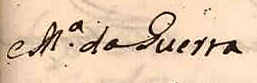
e M.a da Guerra.
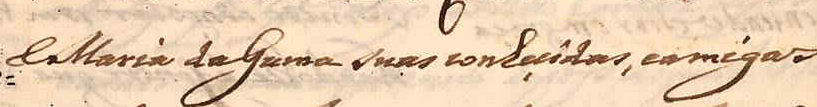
a Maria da Guerra suas conhecidas, e amigas
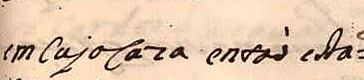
em cuja Caza entaõ esta
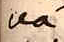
ua
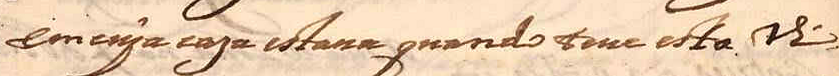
em cuja caza estaua quando teue esta Vi
